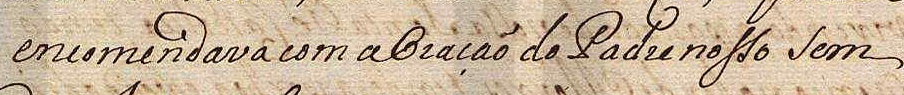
encomendava com a Oraçaõ do Padre nosso Sem
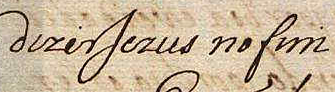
dizer Jezus no fim.
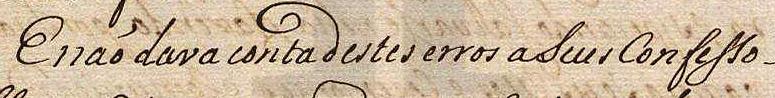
E naõ dava conta destes erros a seus Confesso
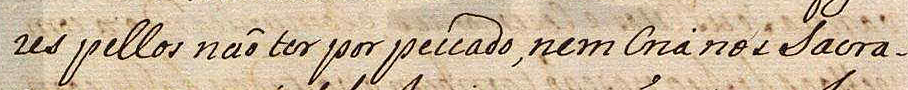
res pellos naõ ter por peccado, nem Cria nos Sacra
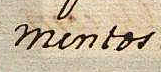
mentos
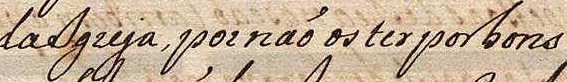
da Igreja, por naõ os ter por bons
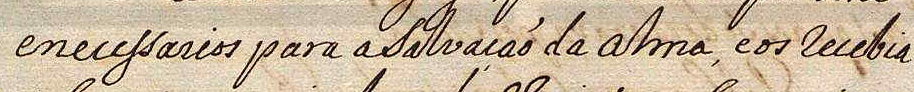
e necessarios para a Salvaçaõ da alma, e os Recebia
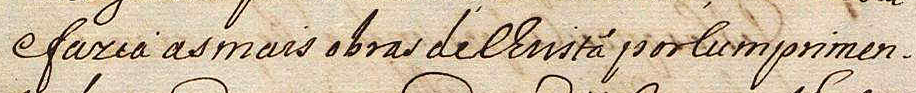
e fazia as mais obras de Christã por cumprimen
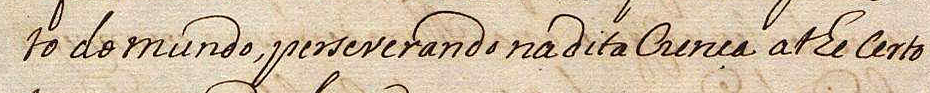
to do mundo, perseverando na dita Crença athe certo
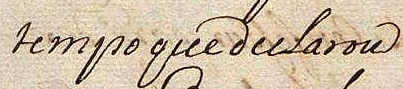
tempo que declarou
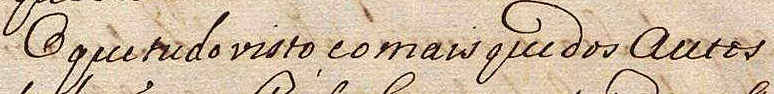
O que tudo visto, e o mais que dos autos
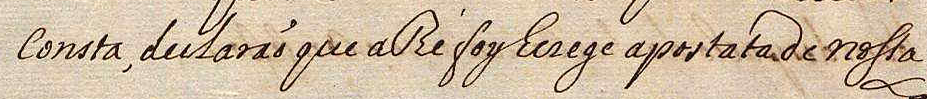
consta declaraõ que a Re foy herege apostata de nossa
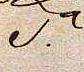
S.ta
